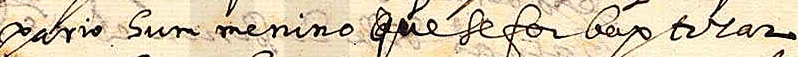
pario hum menino que se foi baptizar
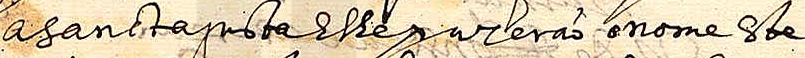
a sancta justa E lhe puzeraõ o nome ste
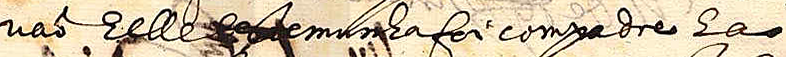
uaõ E elle testemunha foi compadre E a
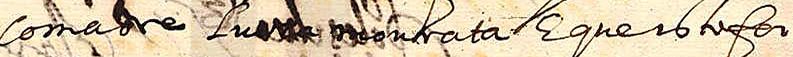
Comadre Luiza mourata E que isto foi
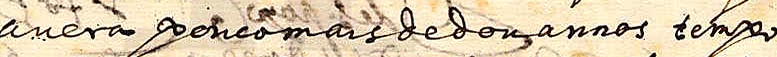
auera pouco mais de dous annos tempo
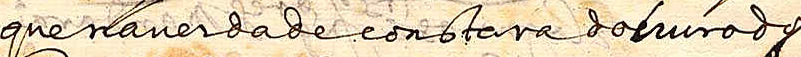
que na uerdade constara do liuro dos
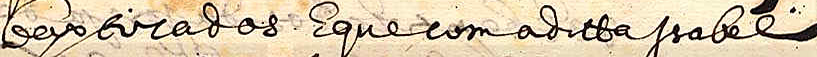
baptizados E que com a ditta jsabel
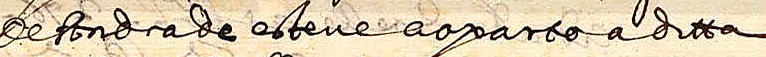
de Andrade esteue ao parto a ditta
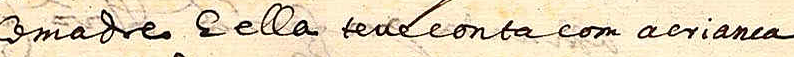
comadre E ella teue conta com a crianca
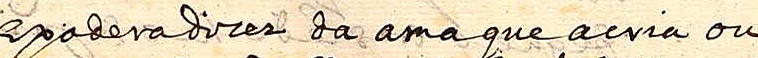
E podera dizer da ama que a cria ou
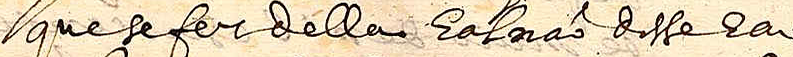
que se fez della E al naõ disse E ao
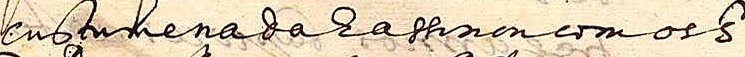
custume nada E assinou com os sres
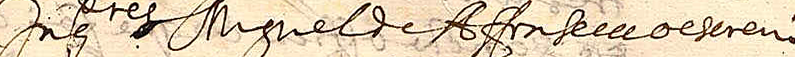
Jnqdres Miguel de Affonseca o escreui
